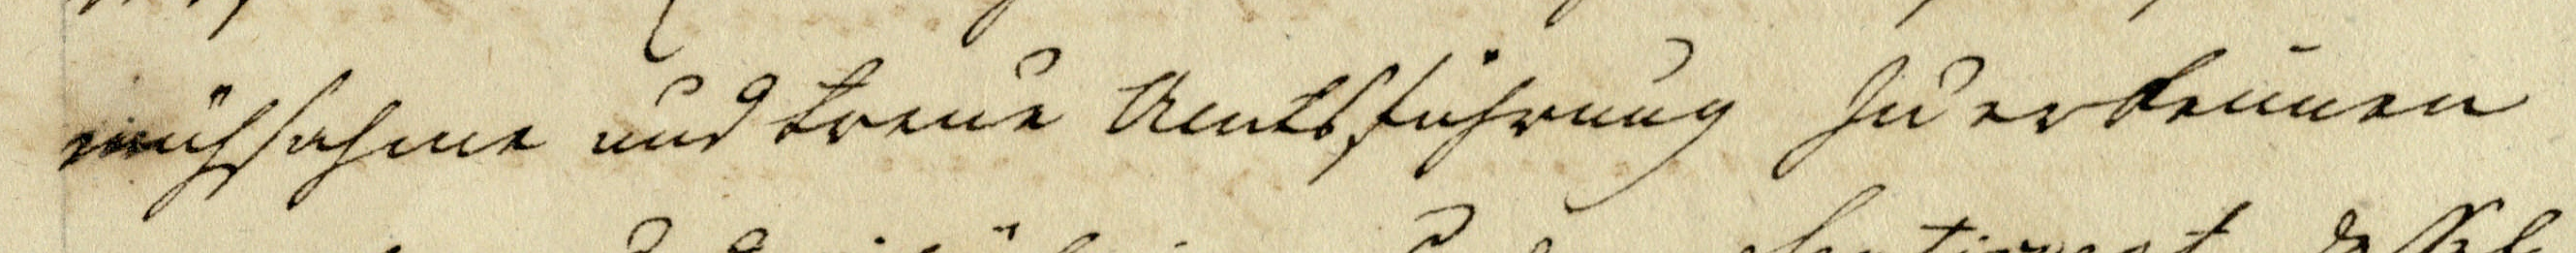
mühsahme und treue Amtsführung zu erkennen
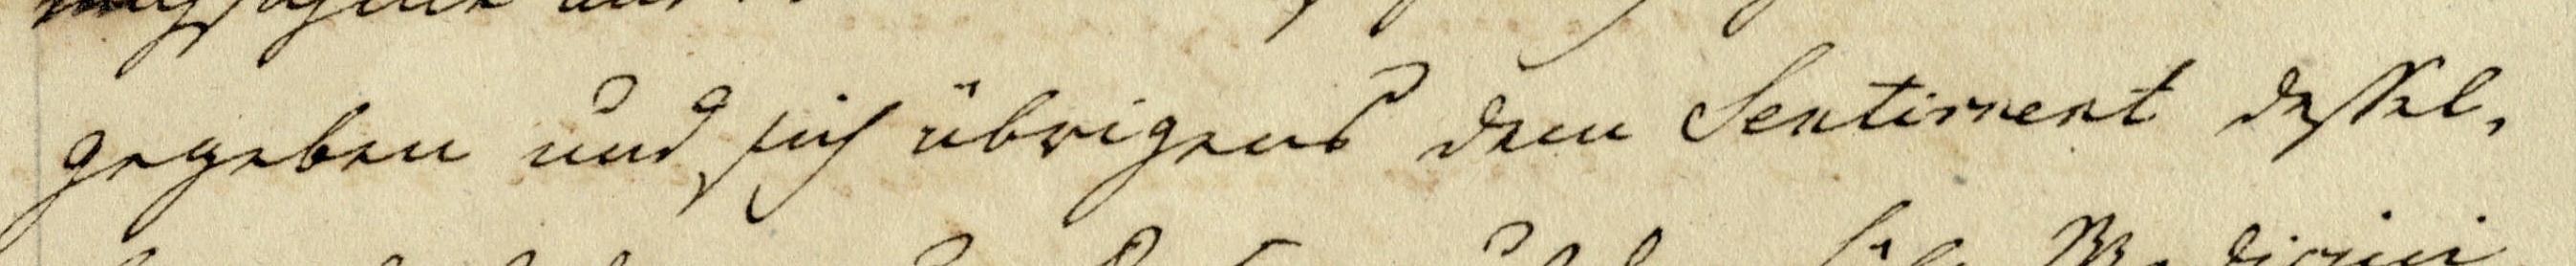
gegeben und sich übrigens dem Sentiment dessel¬
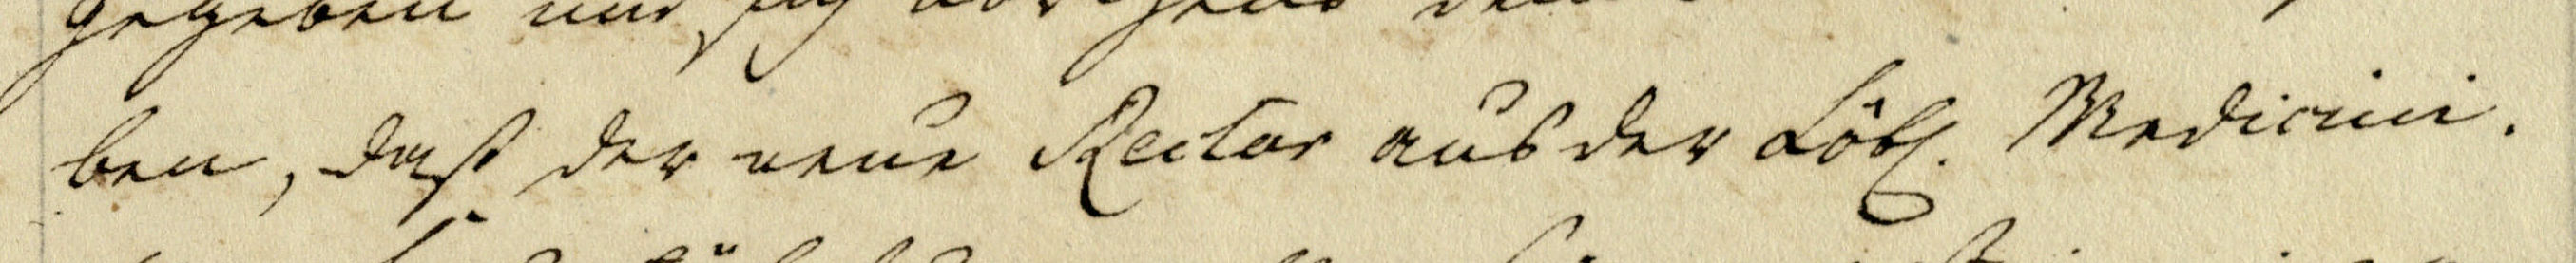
ben, daß der neue Rector aus der Löbl. Medicini¬
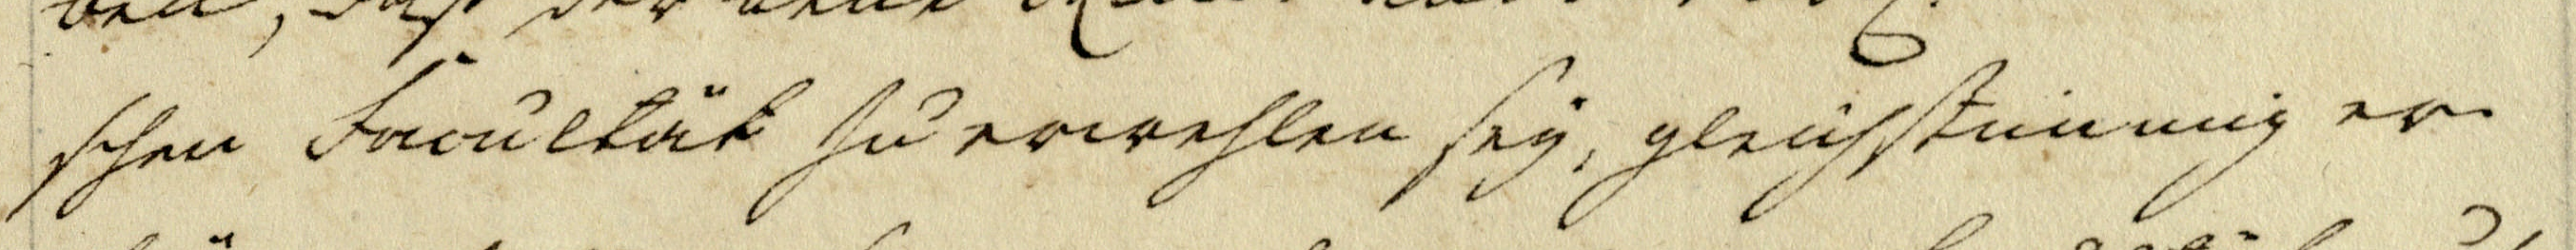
schen Facultät zu erwehlen seÿ, gleichstimmig er¬
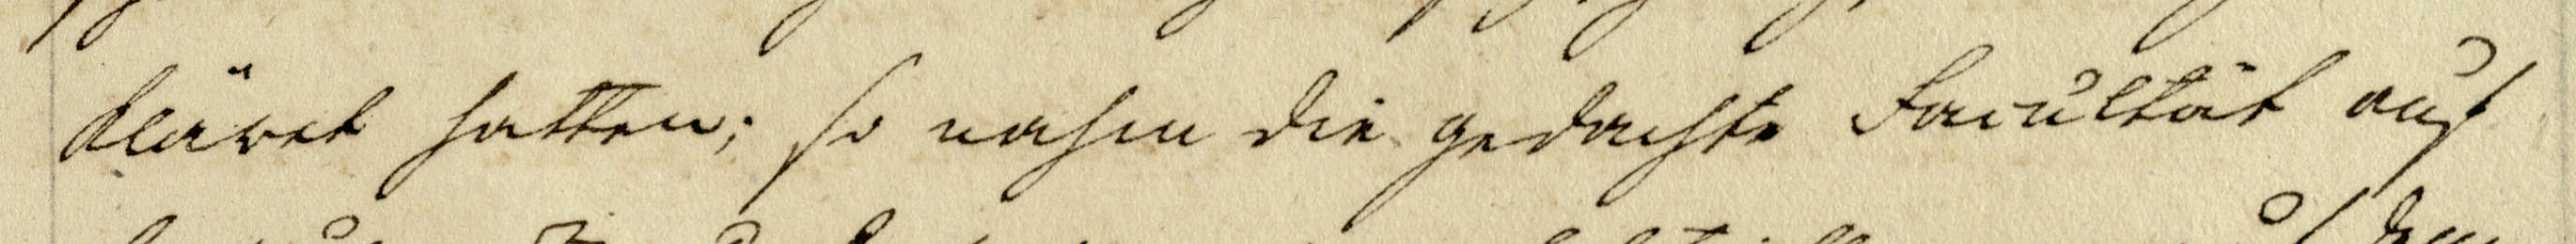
kläret hatten; so nahm die gedachte Facultät auf
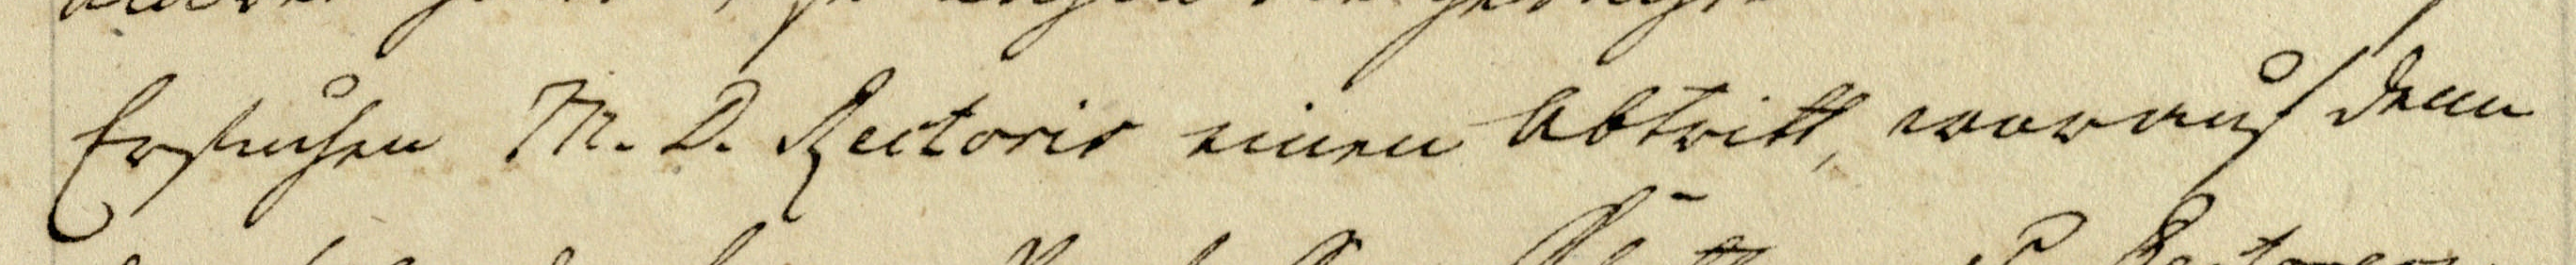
Ersuchen Sr. D. Rectoris einen Abtritt, worauf denn
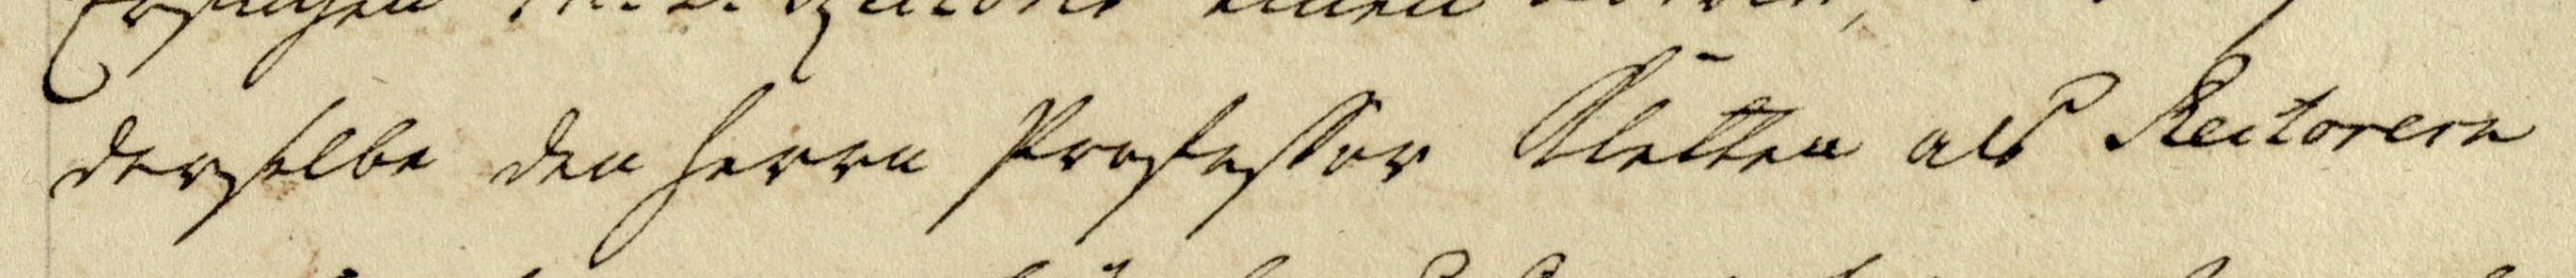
derselbe den Herrn Professor Kletten als Rectorem
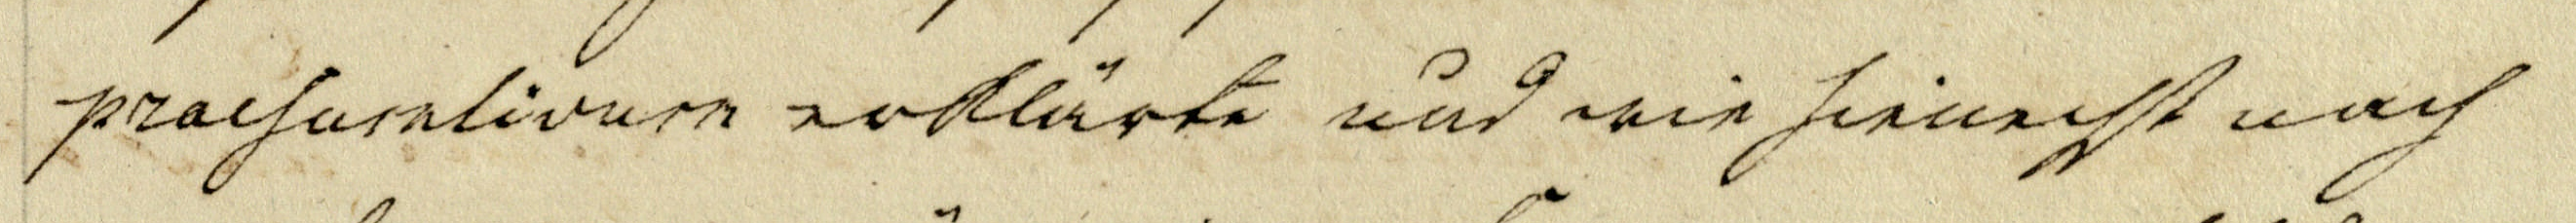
praesumtivum erklärte und wie hienechst nach
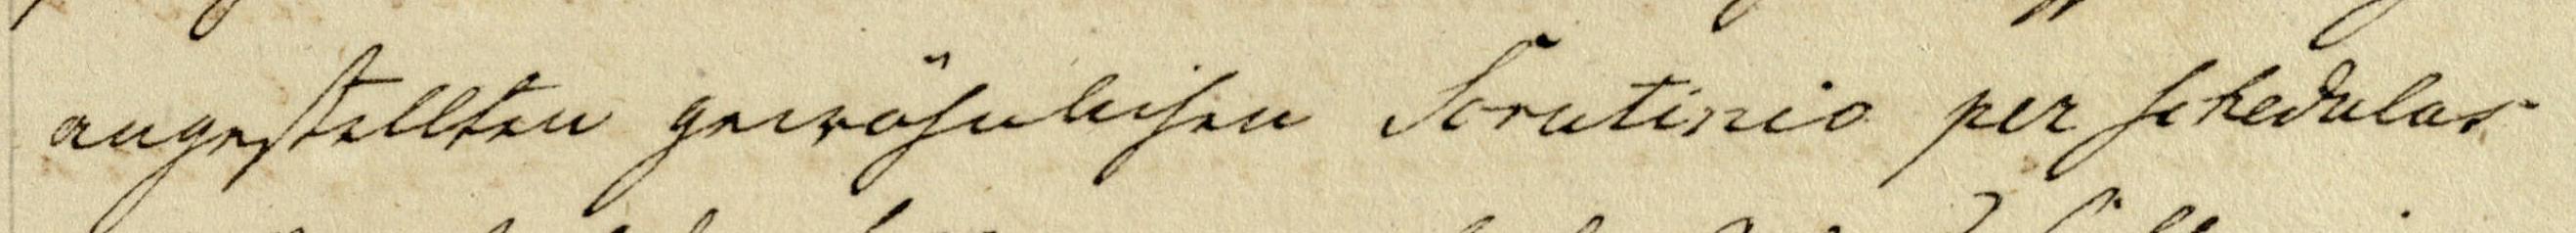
angestellten gewöhnlichen Scrutinio per schedulas
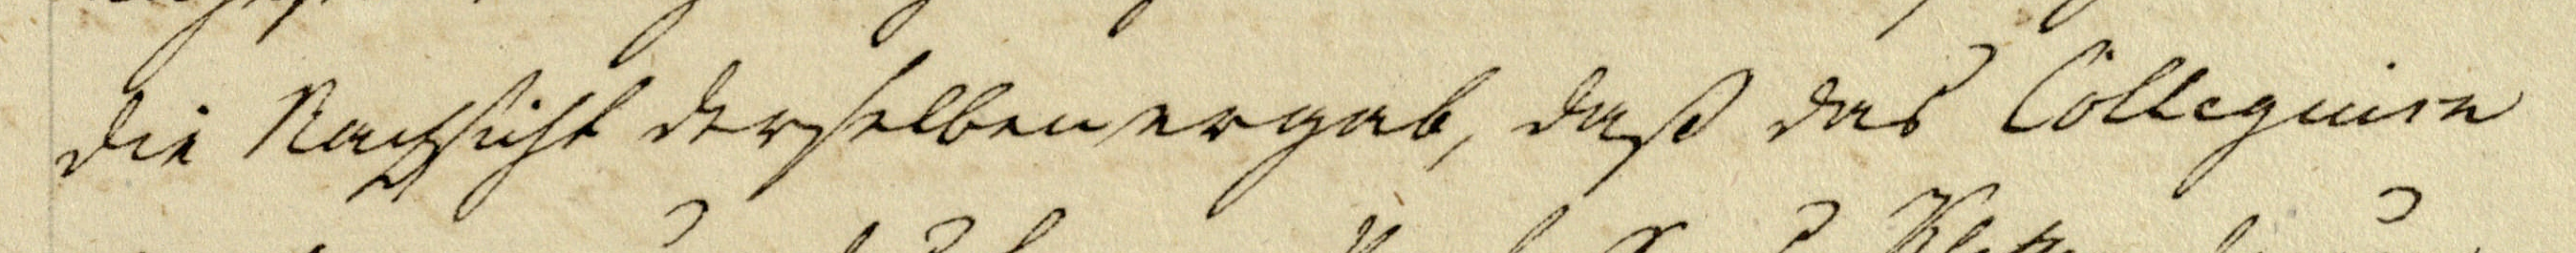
die Nachsicht derselben ergab, daß das Collegium
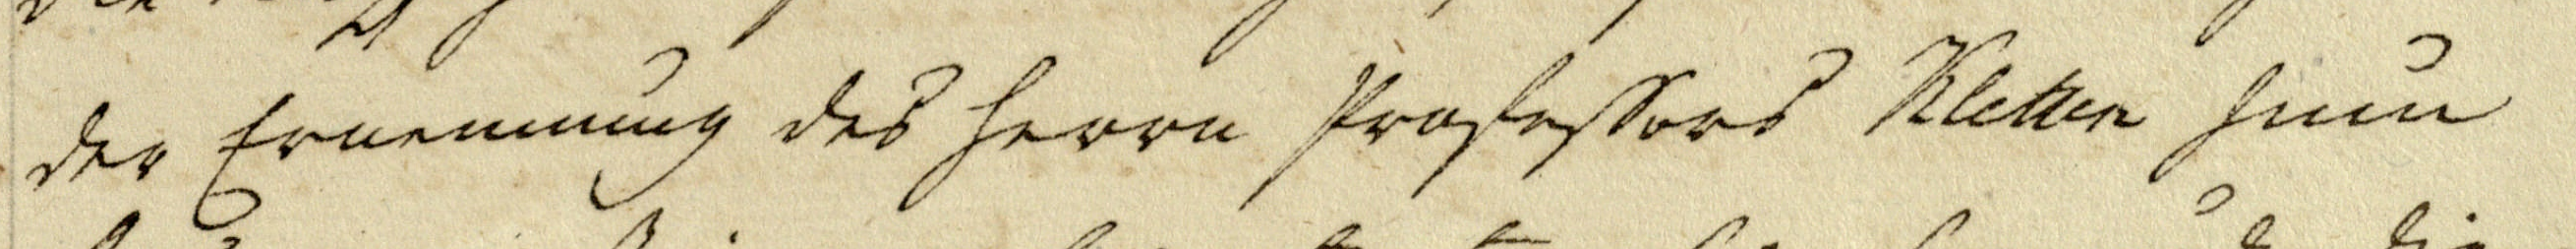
der Ernennung des Herrn Professors Kletten zum
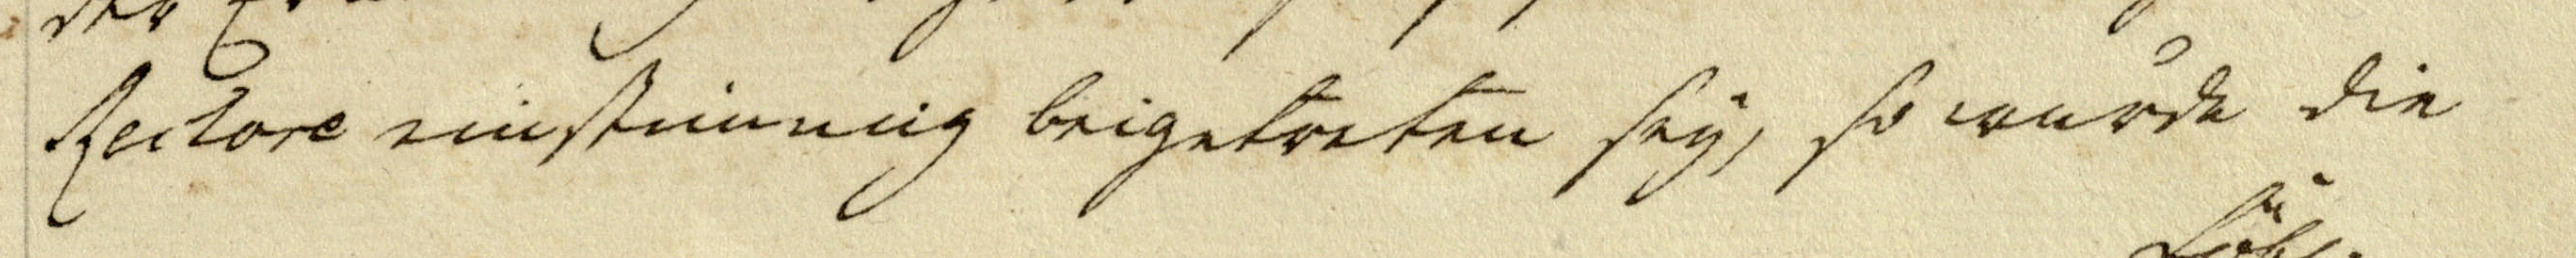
Rectore einstimmig beigetreten seÿ, so wurde die
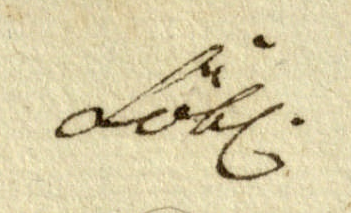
Löbl.
